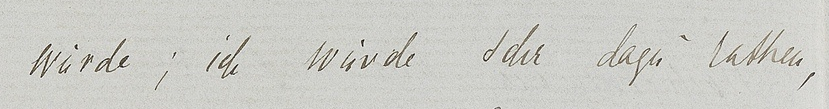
würde; ich würde sehr dazu rathen,
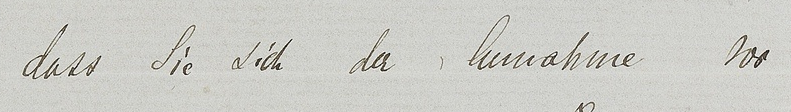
dass Sie sich der Annahme vor
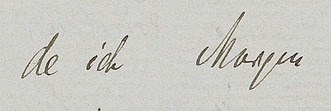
de ich morgen
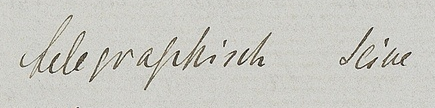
telegraphisch seine
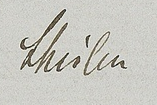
Ansicht
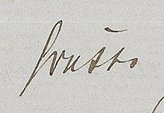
theilen.
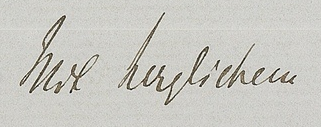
Mit herzlichem
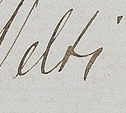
Bern
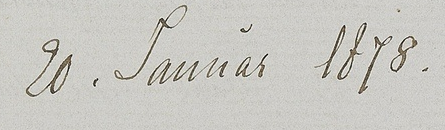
20. Januar 1878.
